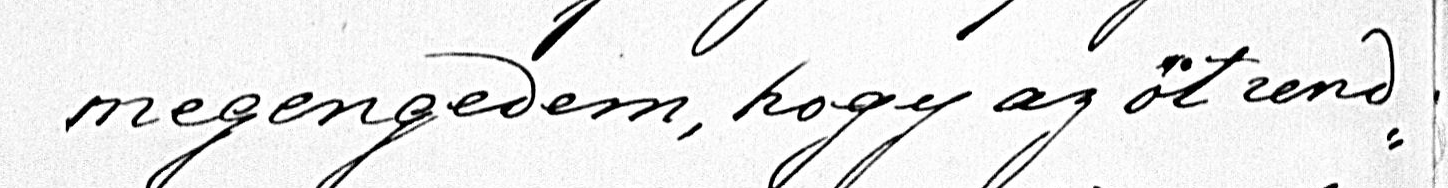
megengedem, hogy az öt rend¬
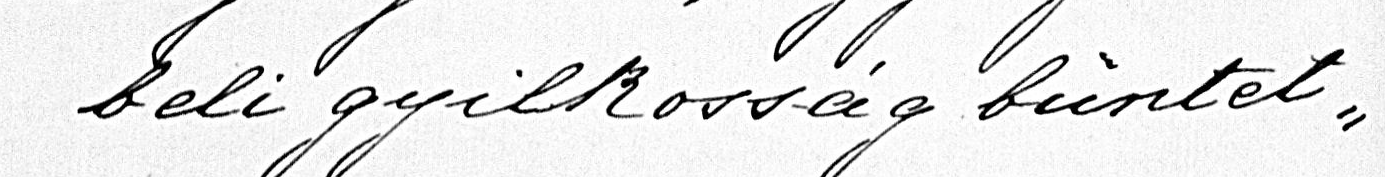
beli gyilkosság büntet¬
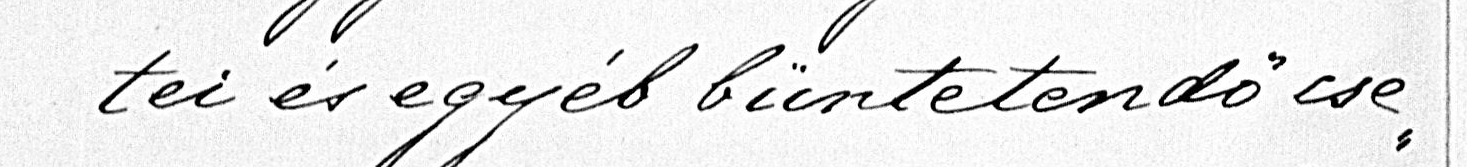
tei és egyéb büntetendö cse¬
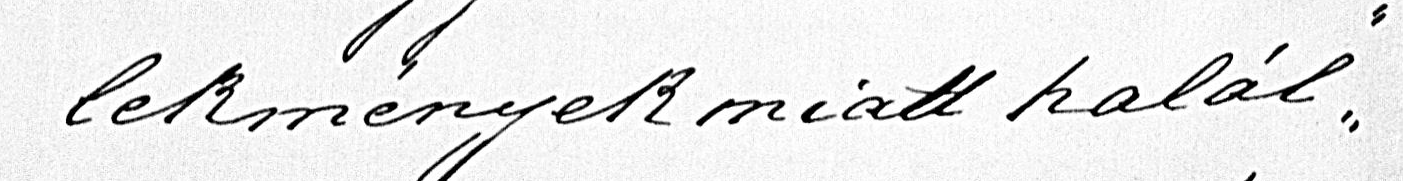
lekmények miatt halál¬
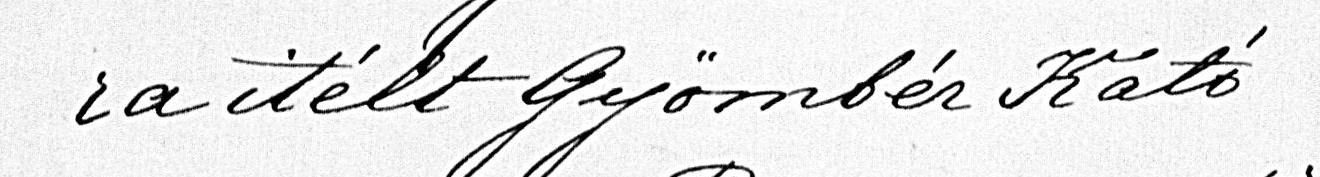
ca itélt Gyömbér Kató
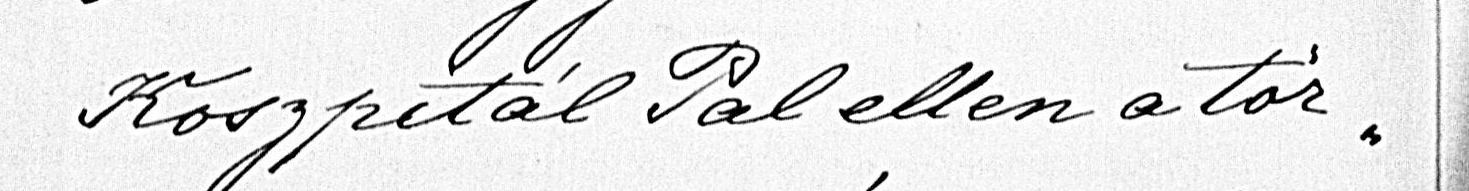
Koszpetál Pal ellen a tör¬
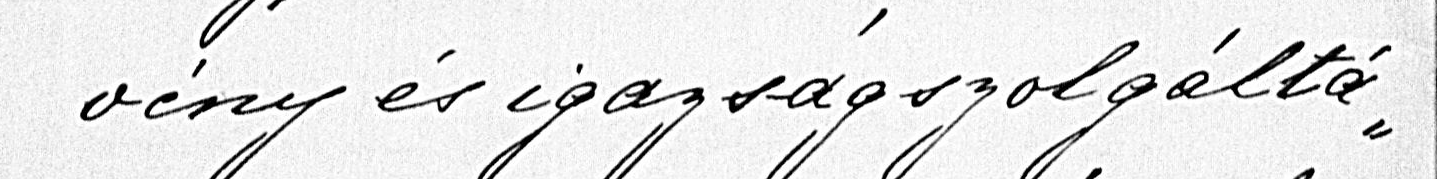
vény és igazságszolgáltá¬
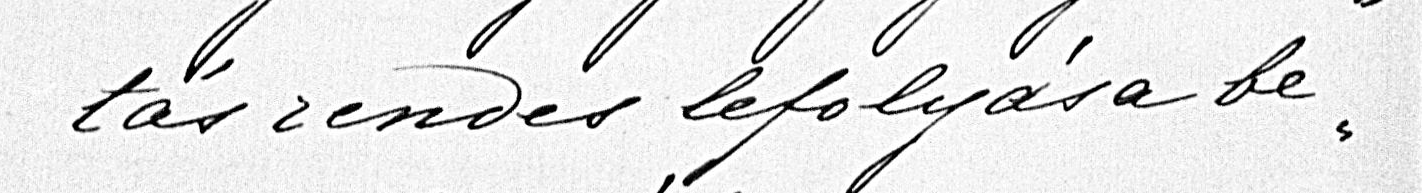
tás cendes lefolyása be¬
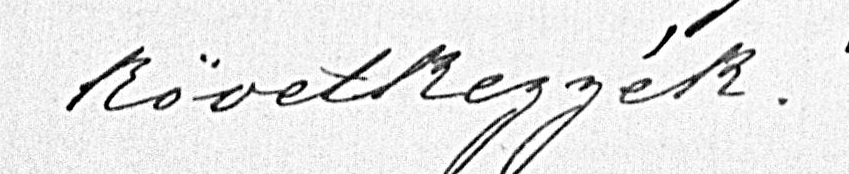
következzék.
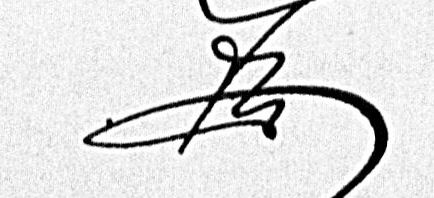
xx
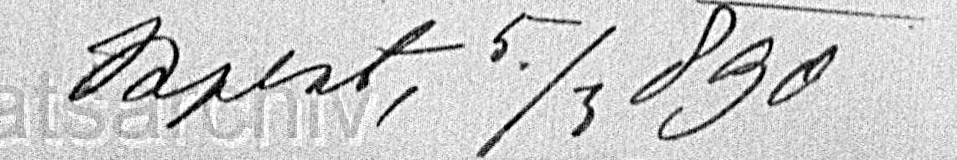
Bxxt, 5./3 890
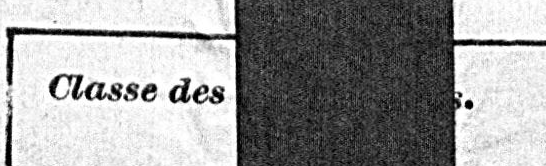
Classe des xx
